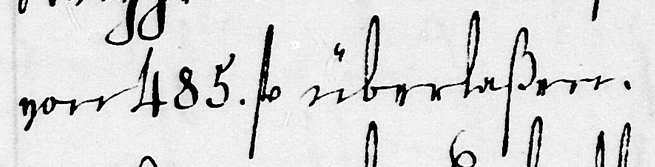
von 485. fl. überlaßen.
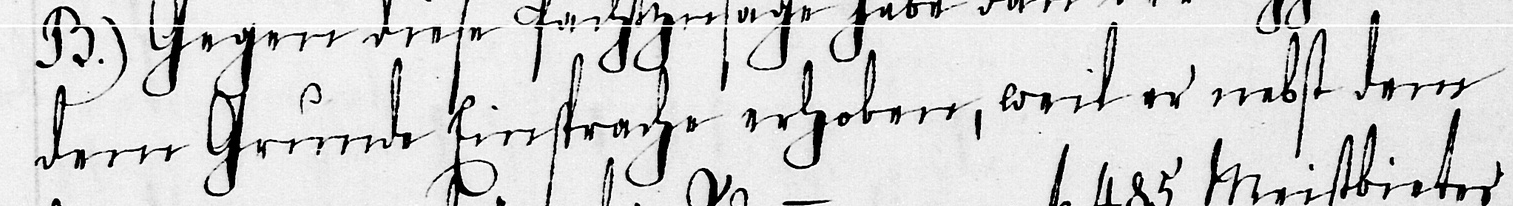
dem Grunde Einsprache erhoben, weil er nebst dem
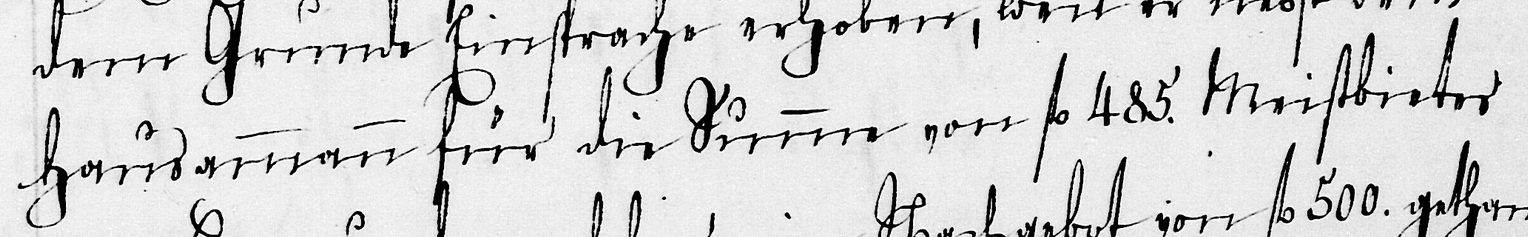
Hausammann für die Summe von fl. 485. Meistbieter
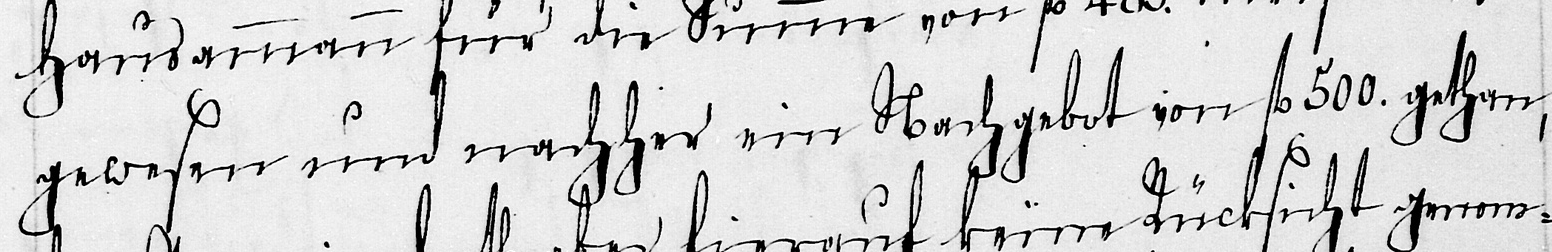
gewesen und nachher ein Nachgebot von fl. 500. gethan,
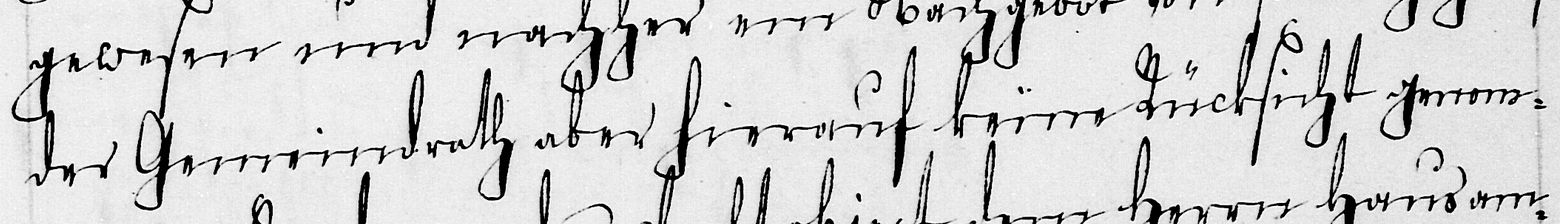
der Gemeindrath aber hierauf keine Rücksicht genom¬
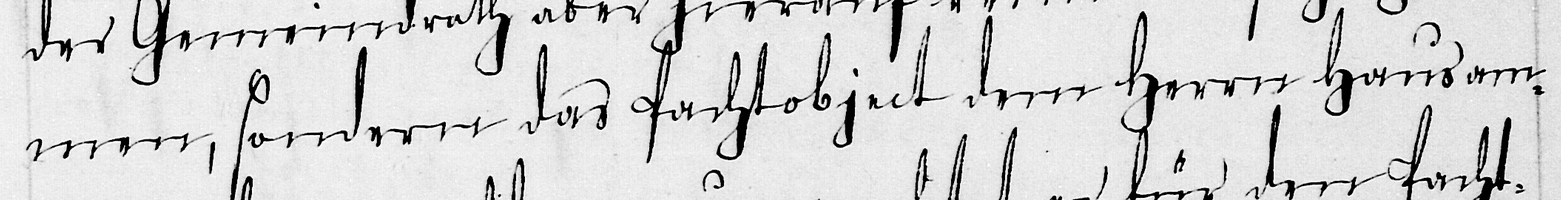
men, sondern das Pachtobject dem Herrn Hausam¬
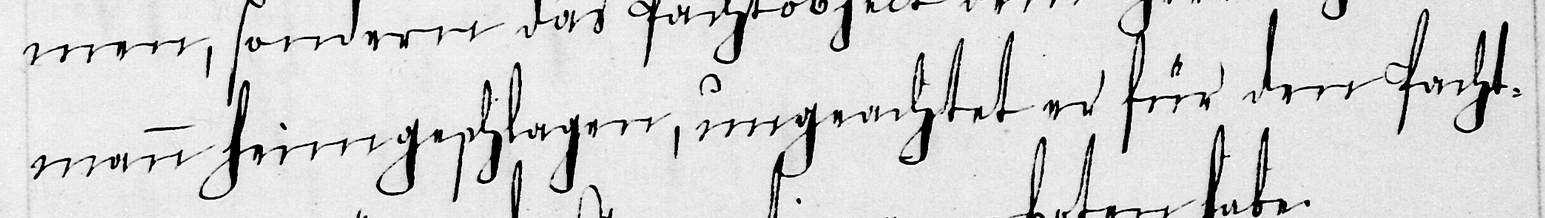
mann heimgeschlagen, ungeachtet er für den Pacht¬
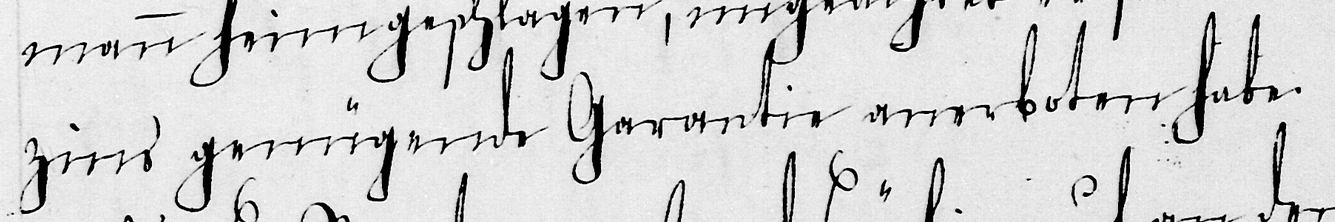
zins genügende Garantie anerboten habe.
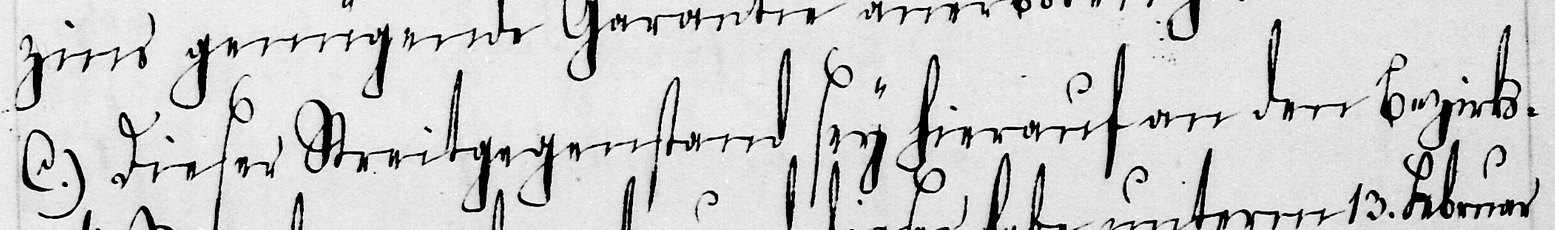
C.) Dieser Streitgegenstand sey hierauf an den Bezirks¬
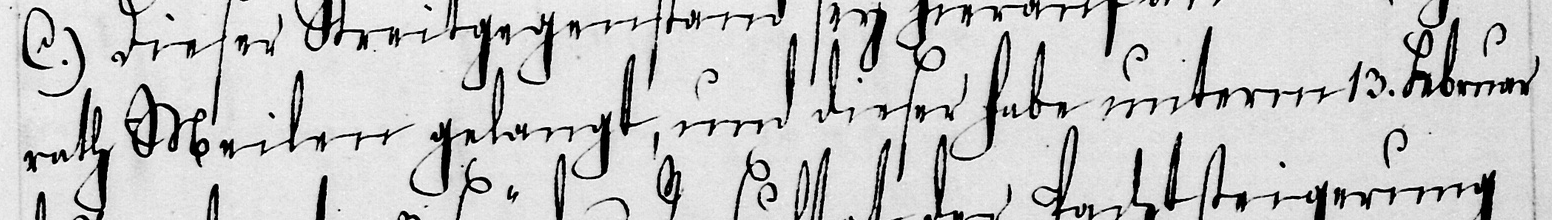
rath Meilen gelangt, und dieser habe unterm 13. Februar
